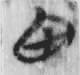甶（思）
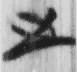之
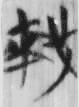○（仇）
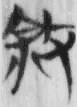叙
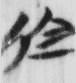於
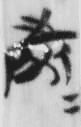之所
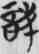○（證）
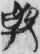與
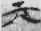亓（其）
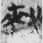○（仇）
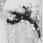又（有）
